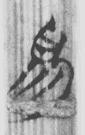易
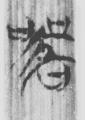{吅客}
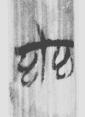𪪋
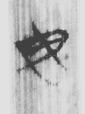母
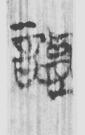詒
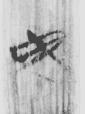母
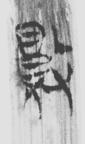敗
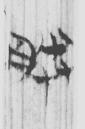朕
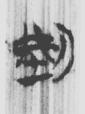型
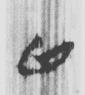㠯（以）
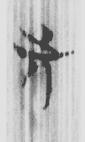{止人}
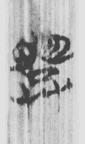興
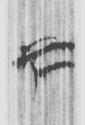下
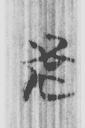{虫尤}
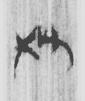夂
